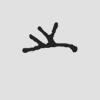出
